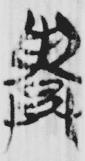興
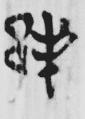邦
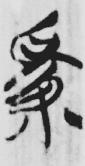○（家）
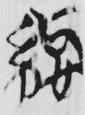○（治）
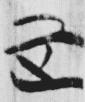正（政）
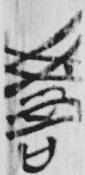教
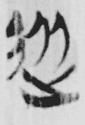從
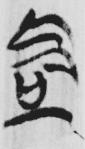命
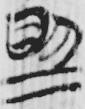則（則）
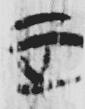正
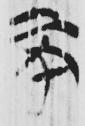不
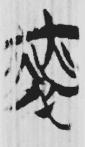○（勞）
